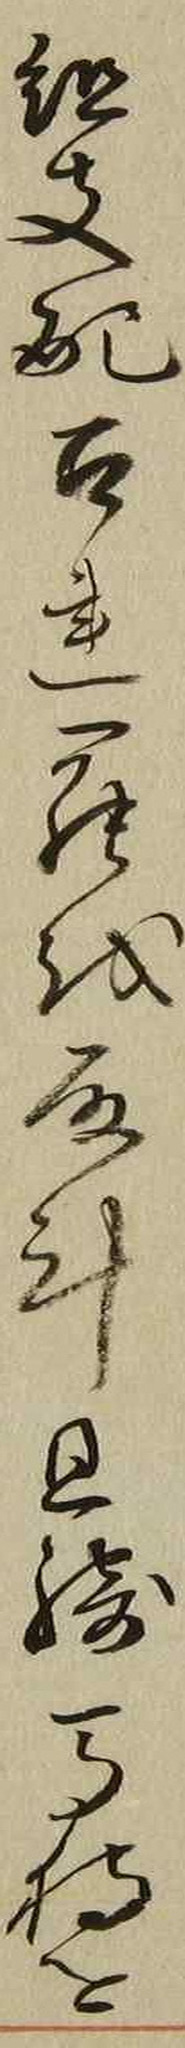組支配召連罷越取計且騎馬狩を
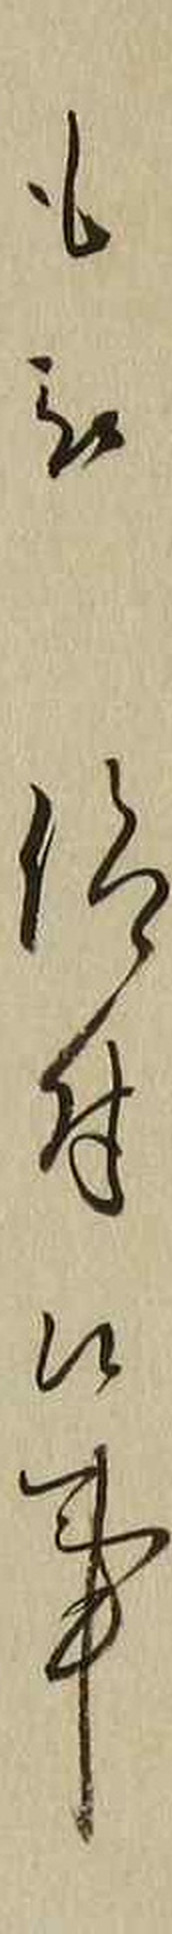も被仰付候事
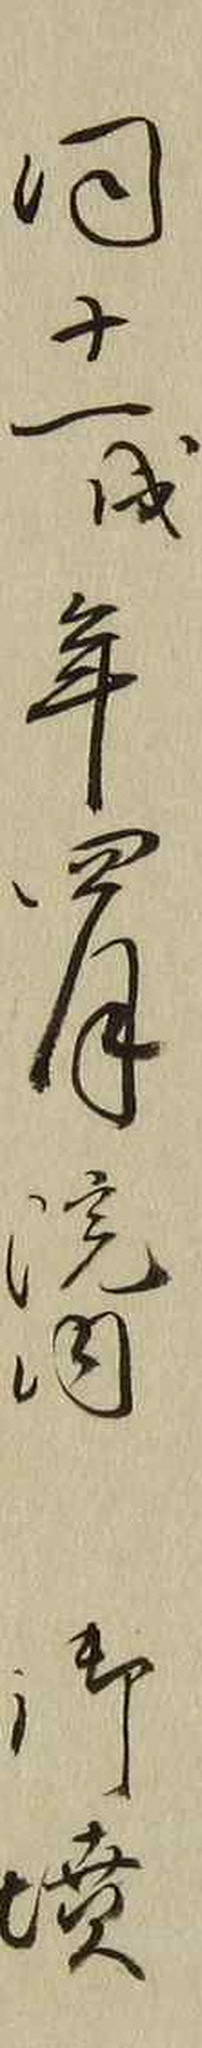一同十一戌年四月院内御墳
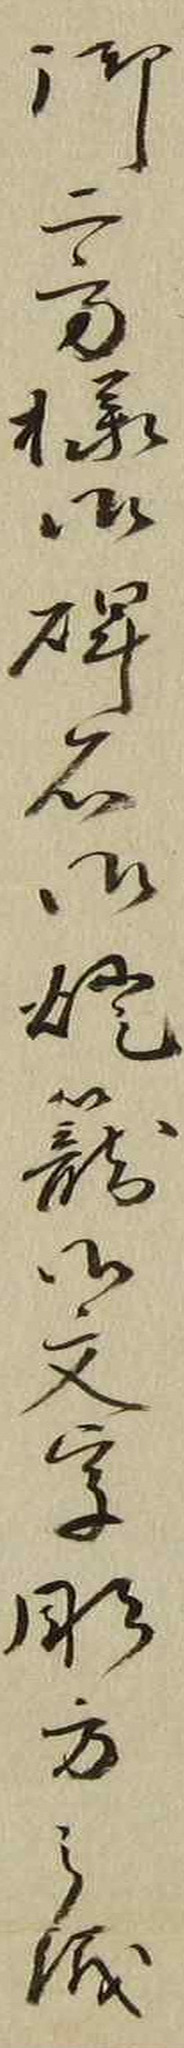御二方様御碑名御灯籠御文字彫方之儀
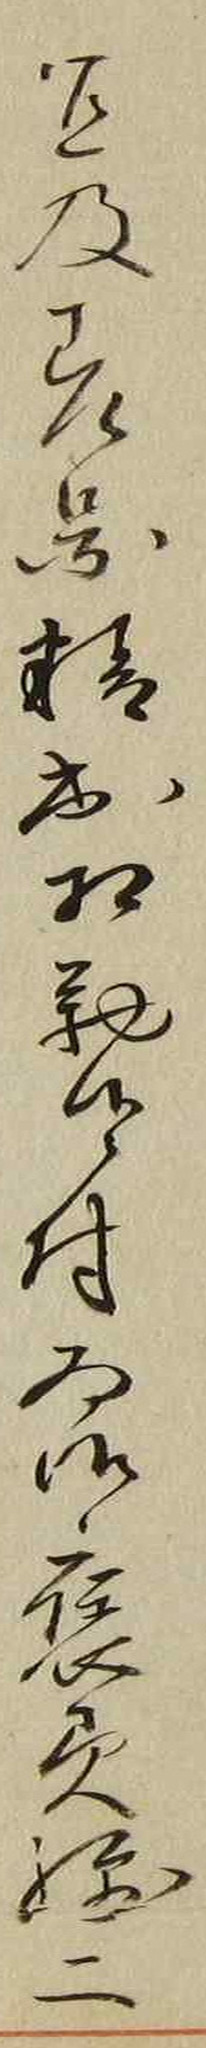宜及差図精出相勤候に付為御褒美綿二
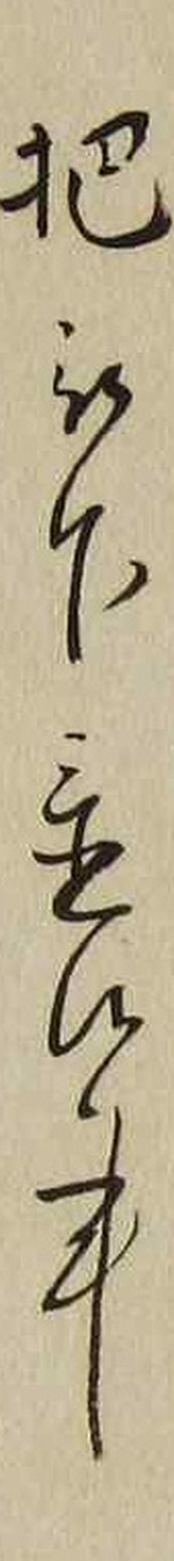把被下置候事
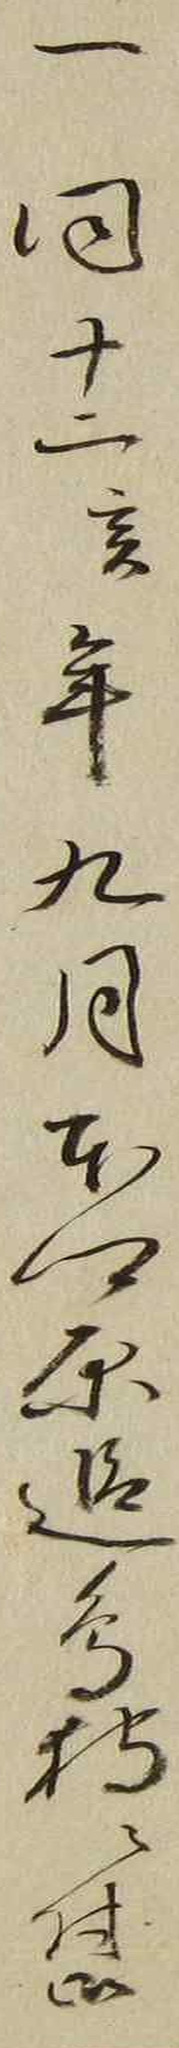一同十二亥年九月本郷原追鳥狩に付御

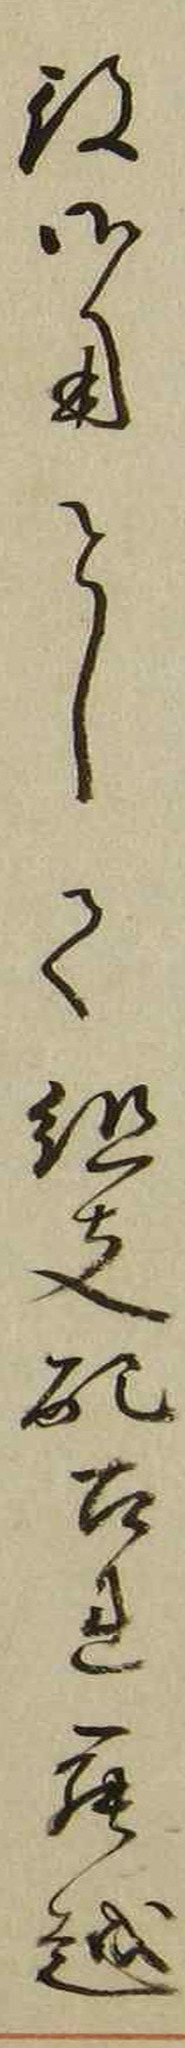役御用として組支配召連罷越
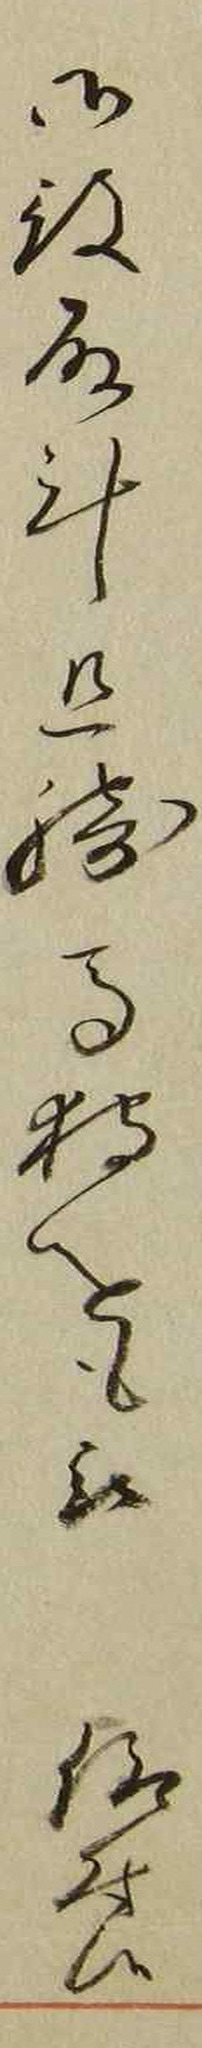御役取計且騎馬狩をも被仰付候
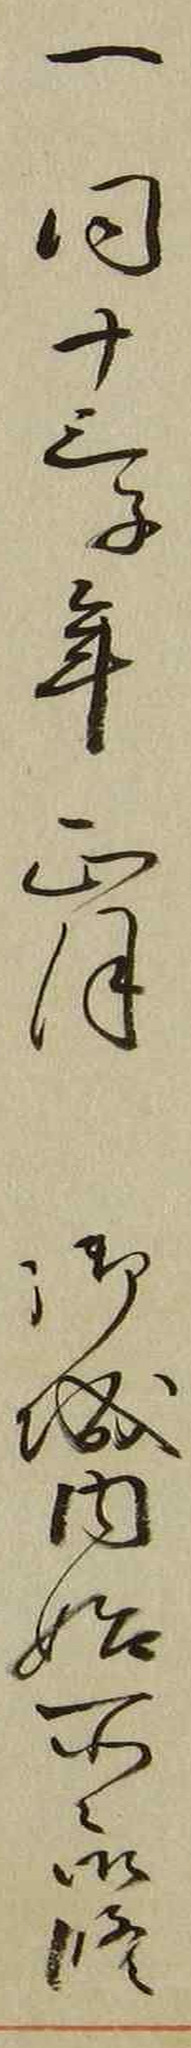一同十三子年正月御城内始所々御修
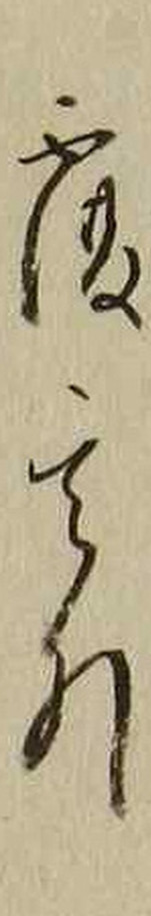覆其外
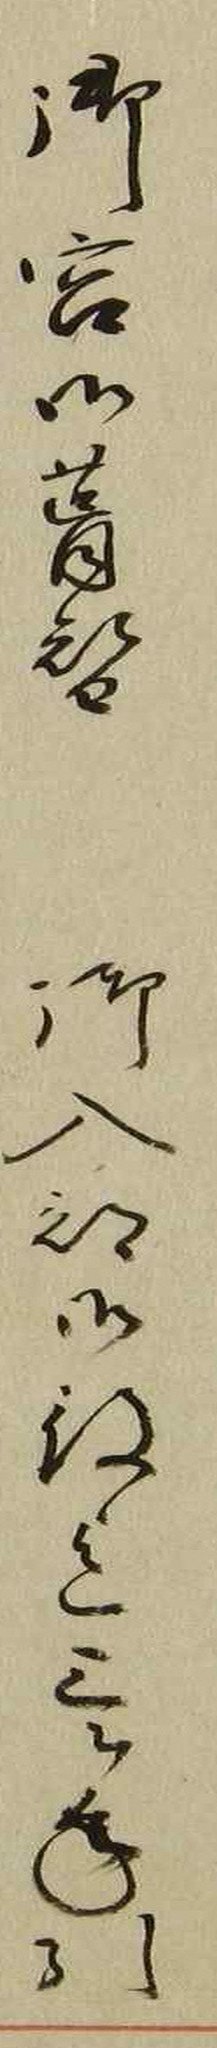御宮御葺替御入部御役迄三ヶ年引
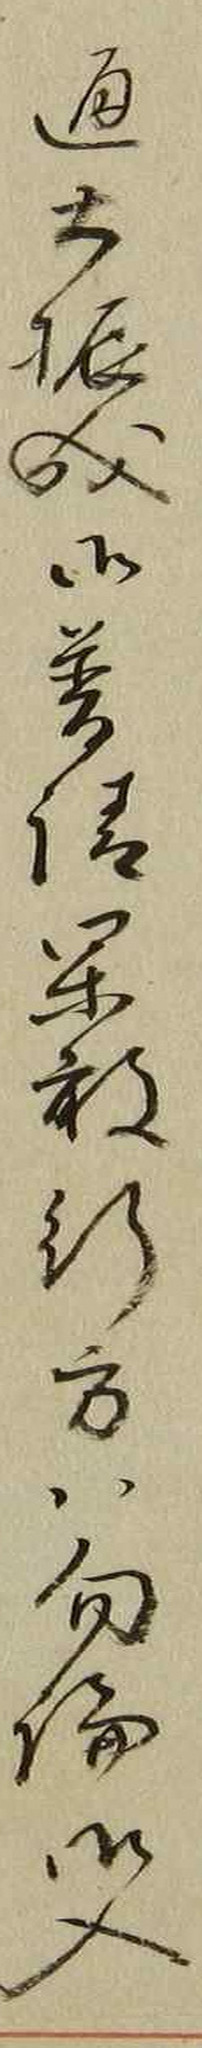通大振成御普請果敢行方は勿論御入
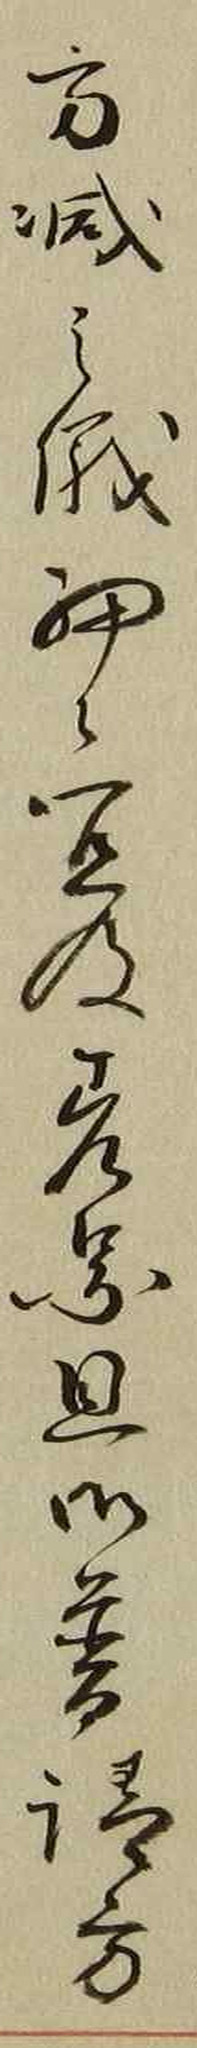方減之儀細々宜及差図且御普請方
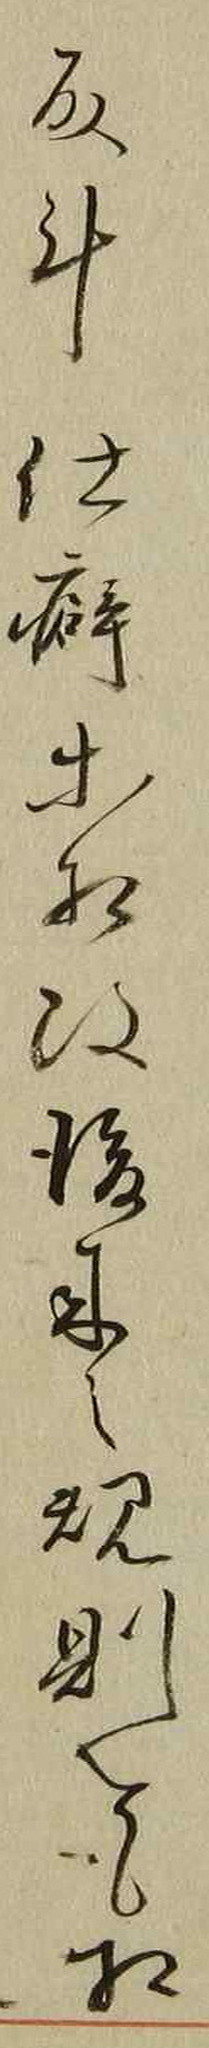取計仕癖等相改後来之規則をも相
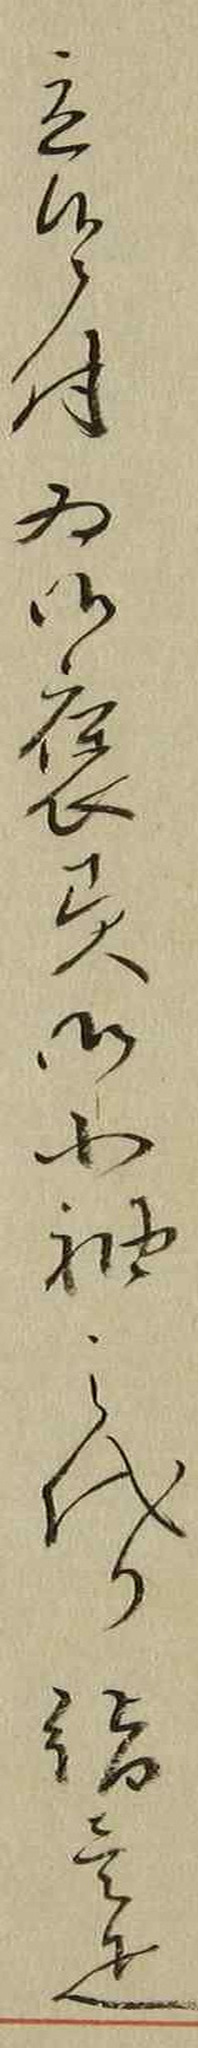立候に付為御褒美御小袖之代り絹壱疋
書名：諸士系譜　巻之3　い之部3
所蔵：会津若松市立会津図書館
